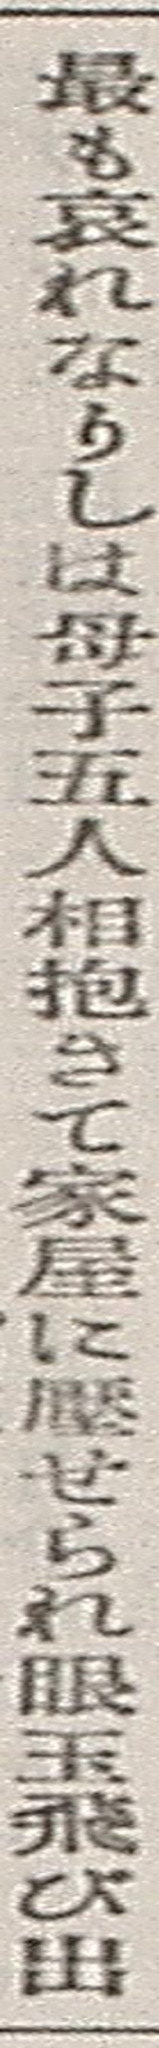最も哀れなりしは母子五人相抱きて家屋に壓せられ眼玉飛び出
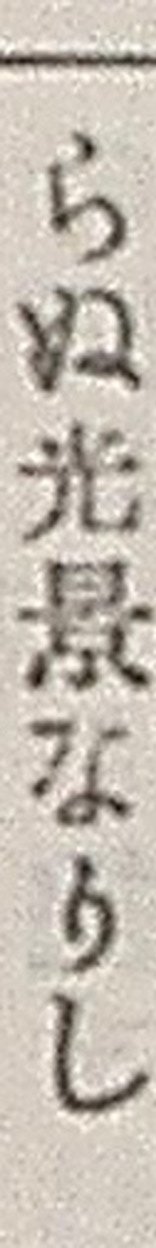らぬ光景なりし
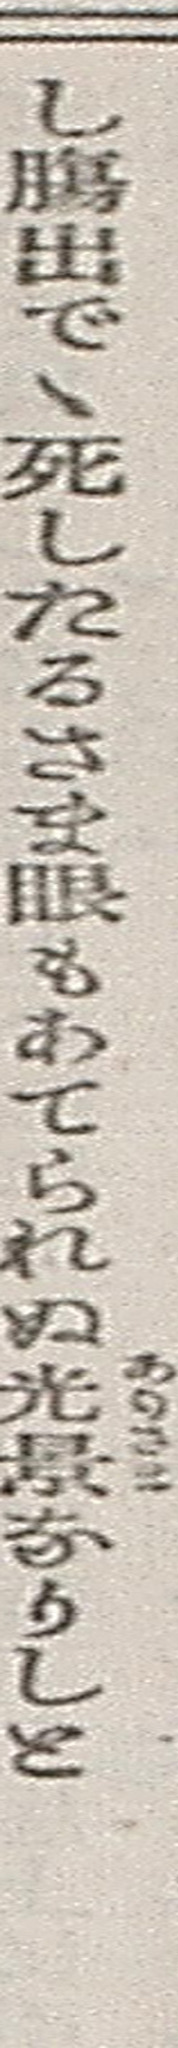し腸出でゝ死したるさま眼もあてられぬ光景なりしと
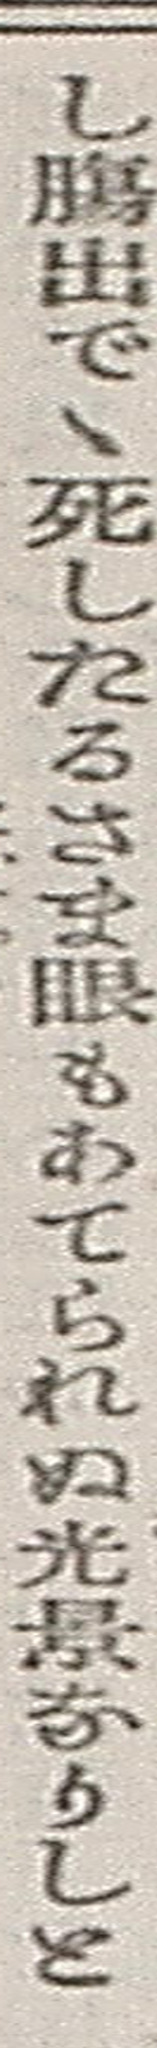し腸出でゝ死したるさま眼もあてられぬ光景なりしと
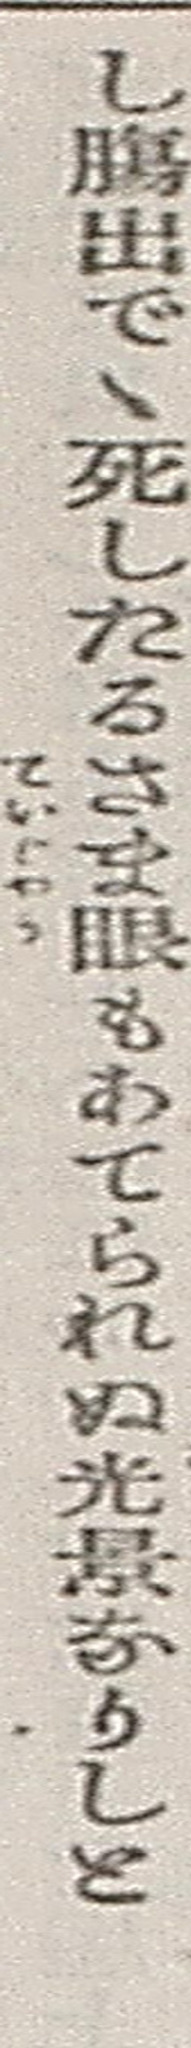し腸出でゝ死したるさま眼もあてられぬ光景なりしと
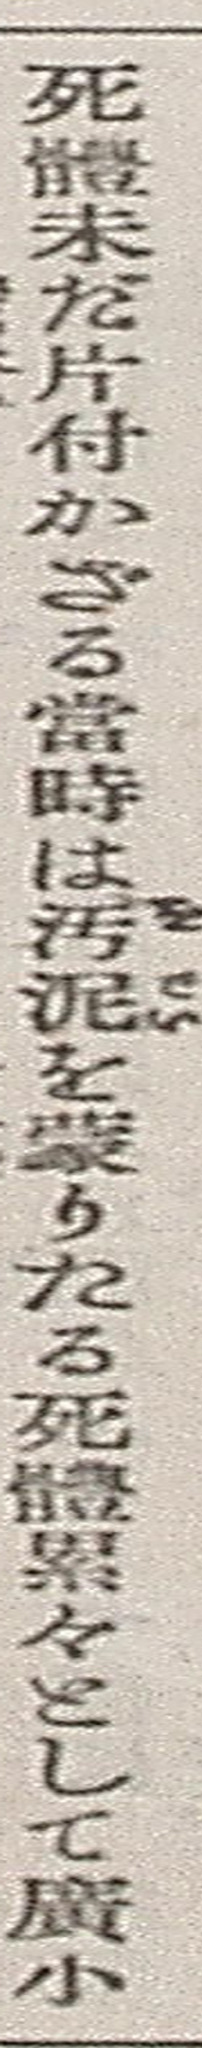死体未だ片付かざる当時は汚泥を蒙りたる死体累々として広小
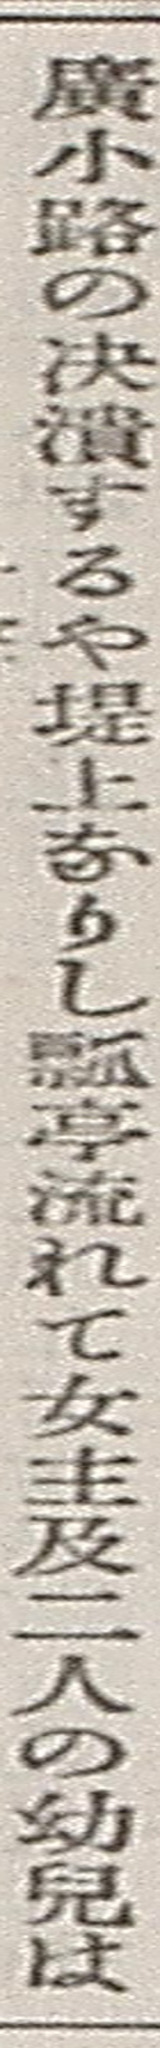広小路の决潰するや堤上なりし瓢亭流れて女主及二人の幼児は
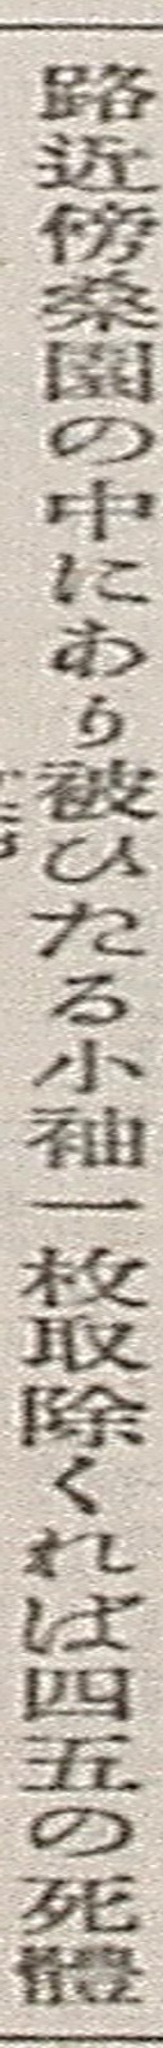路近傍桑園の中にあり被ひたる小袖一枚取除くれば四五の死体
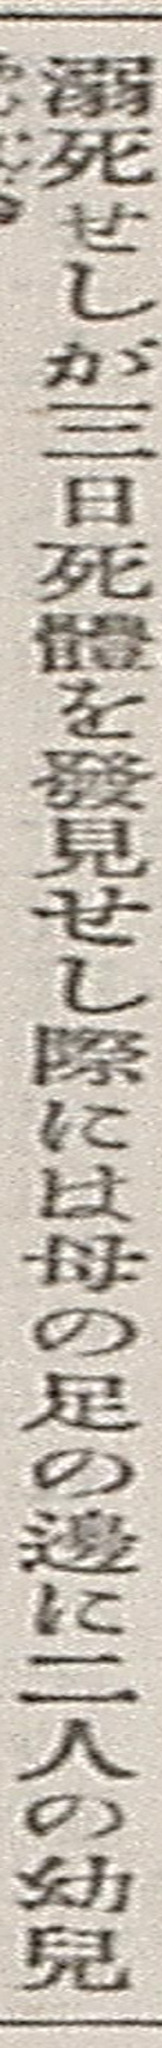溺死せしが三日死体を発見せし際には母の足の辺に二人の幼児
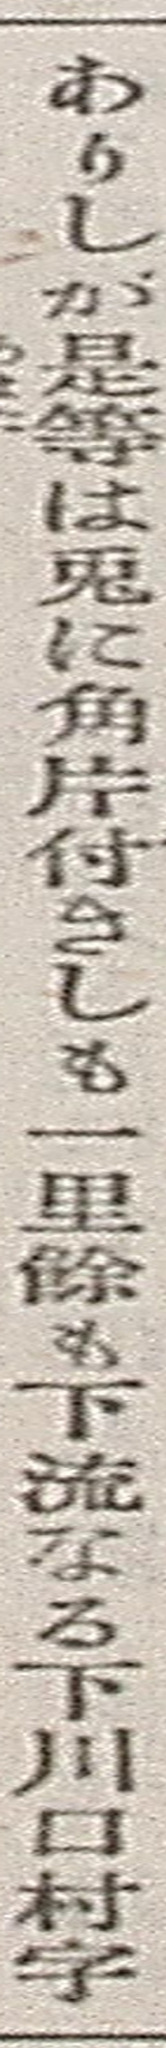ありしが是等は兎に角片付きしも一里餘も下流なる下皮口村字
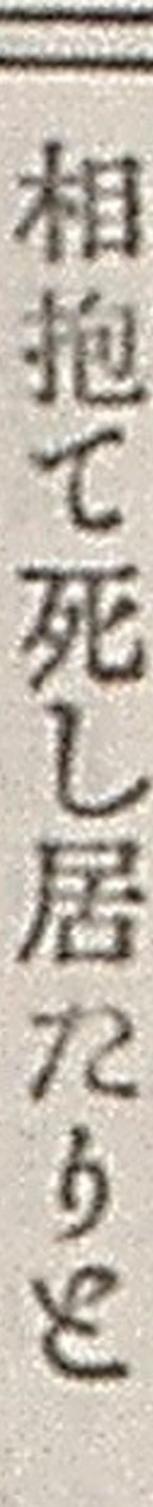相抱て死し居たりと
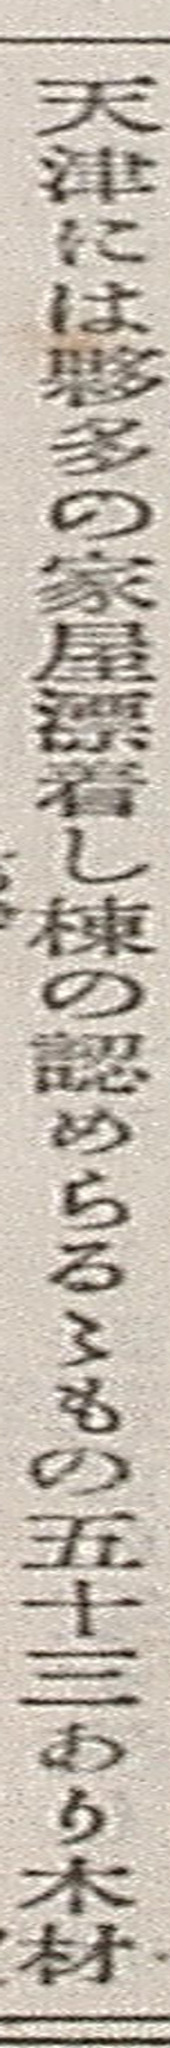天津には夥多の家屋漂着し棟の認めらるゝもの五十三あり木材
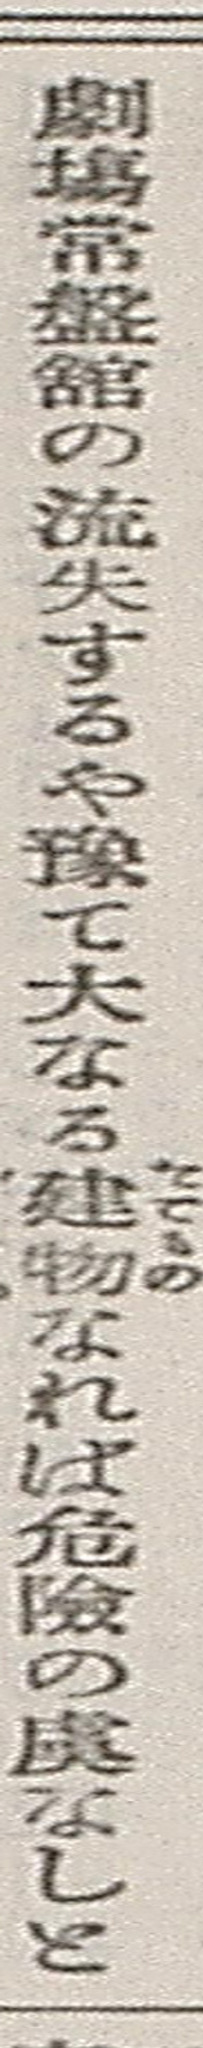劇場常盤館の流失するや豫て大なる建物なれば危険の虞なしと
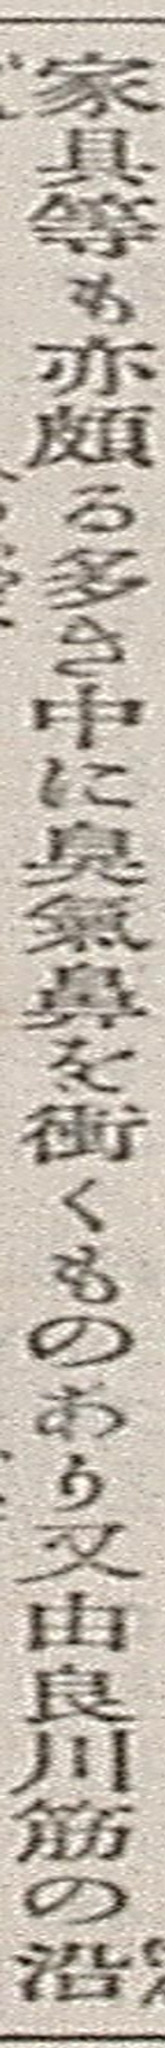家具等も亦頗る多き中に臭気鼻を衝くものあり又由良川筋の沿
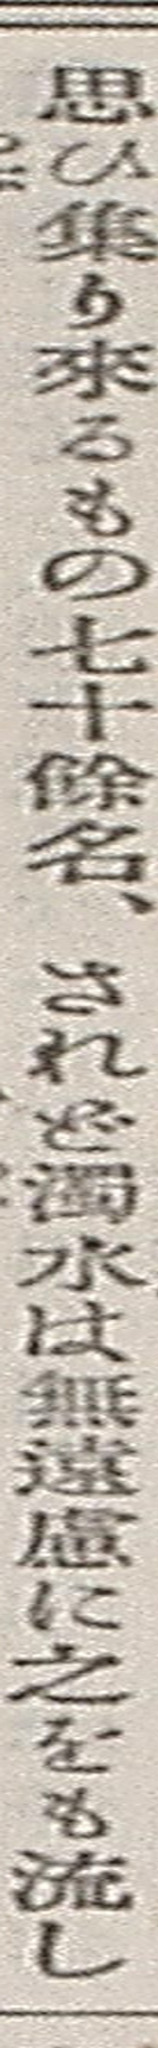思ひ集り来るもの七十餘名、されど濁水は無遠慮に之をも流し
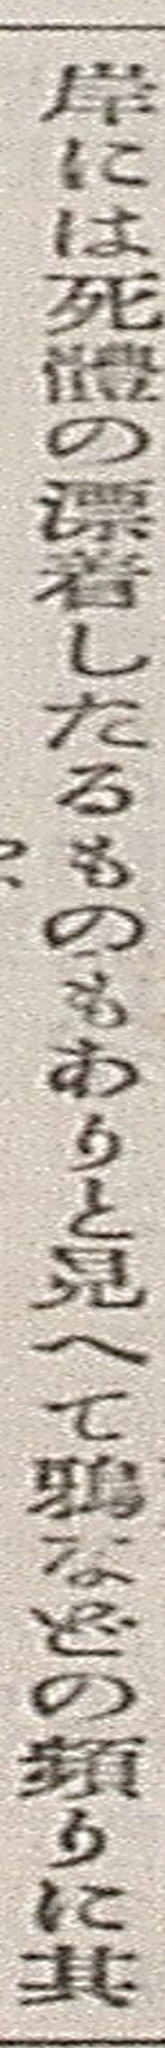岸には死体の漂着したるものありと見へて烏などの頻りに其
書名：風俗畫報臨時増刊第百二十六號　洪水被害録（中）
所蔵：東京大学地震研究所図書室 Earthquake Research Institute Library, The University of Tokyo, JAPAN
